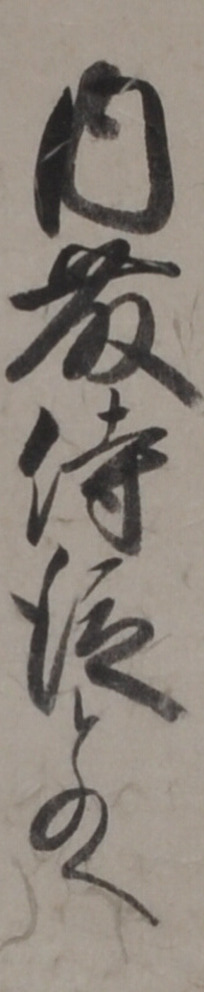内藤侍従とのへ

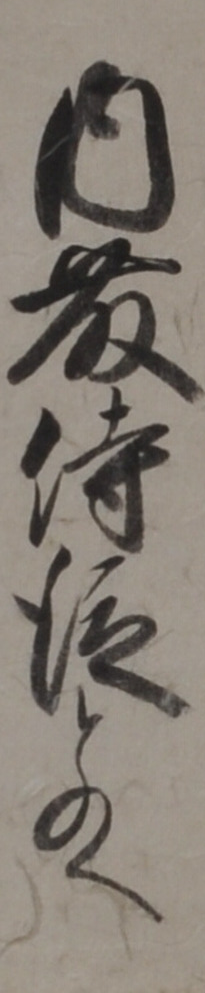内藤侍従とのへ

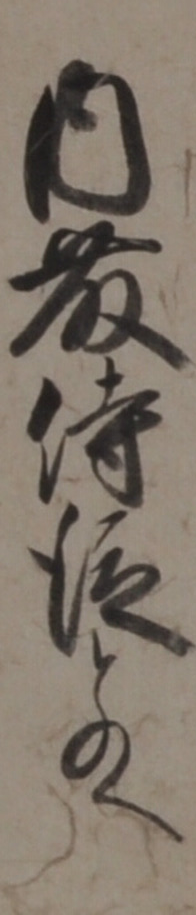内藤侍従とのへ
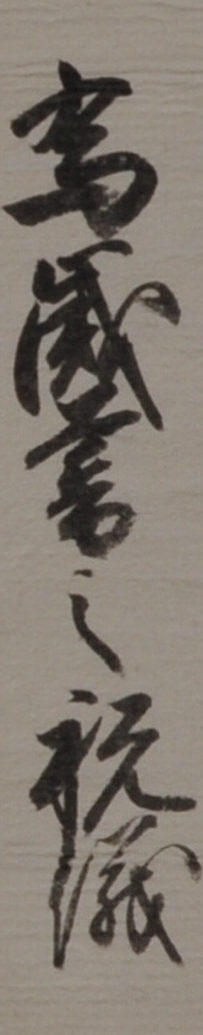為歳暮之祝儀
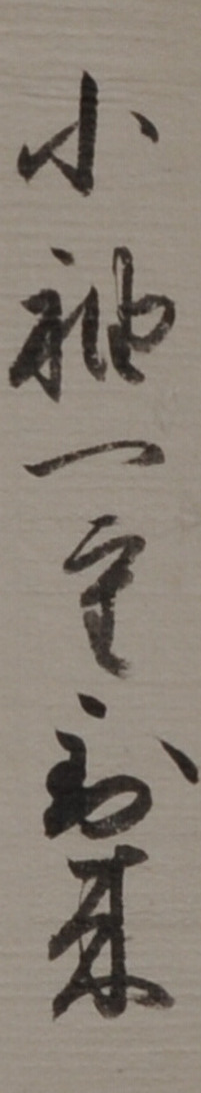小袖一重到来
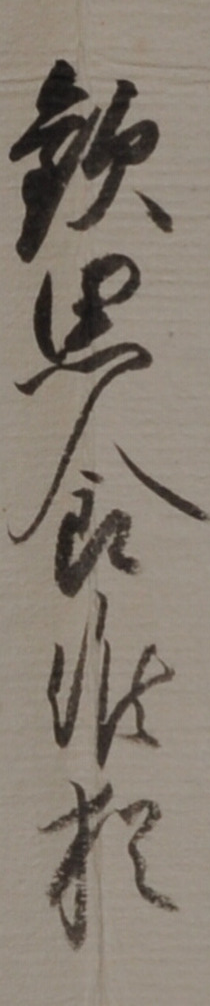歓思食候猶
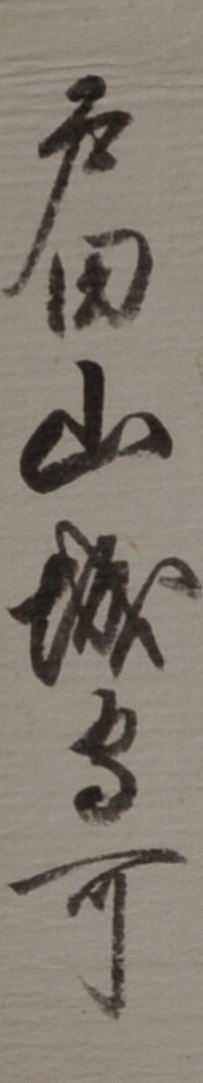戸田山城守可
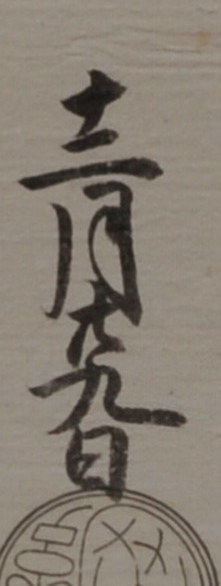十二月廿九日
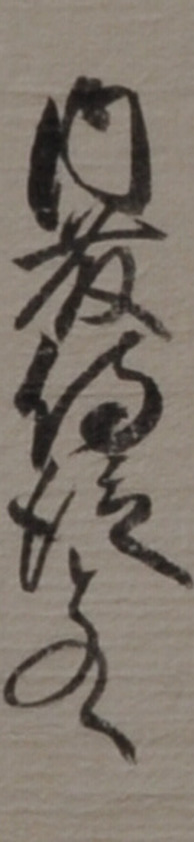内藤侍従とのへ
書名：御内書
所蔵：伊那市立高遠町図書館・合同会社AMANE
